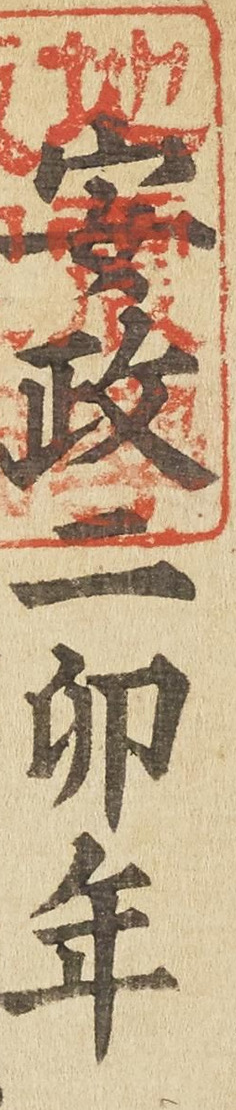安政二卯年
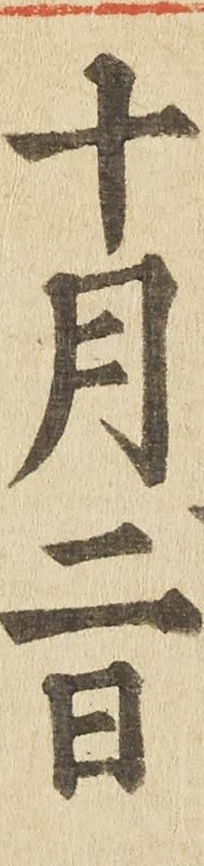十月二日
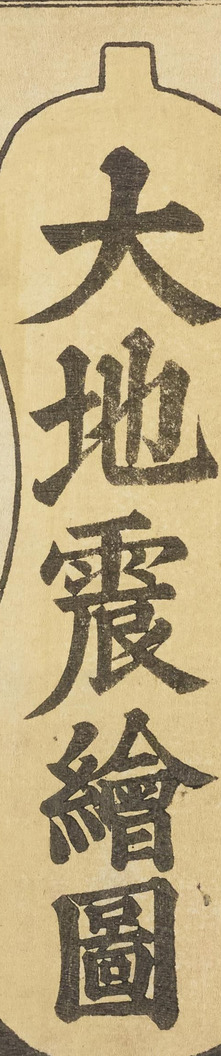大地震絵図
